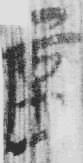危
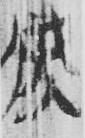安
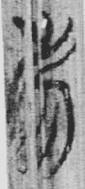廌（存）
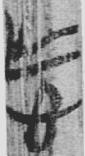忘（亡）
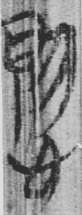惻（賊）
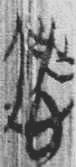○（盜）
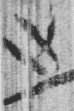之
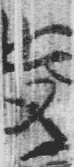拃（作）
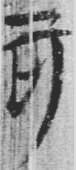可
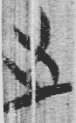之〈先〉
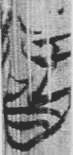智（知）
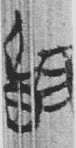○（聞）
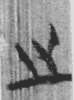之
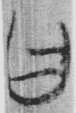曰
